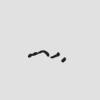像
